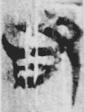右（佑）
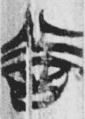善
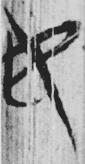女（如）
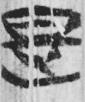是
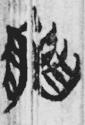○（狀）
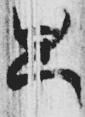也
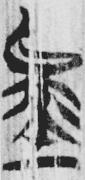舜
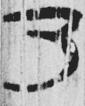乃
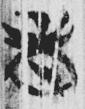老
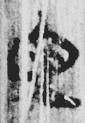視
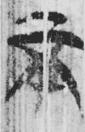不
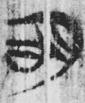明
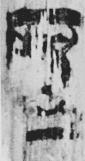聖（聽）
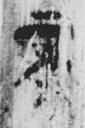不
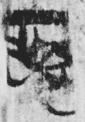聰
